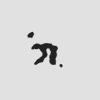亓（其）
